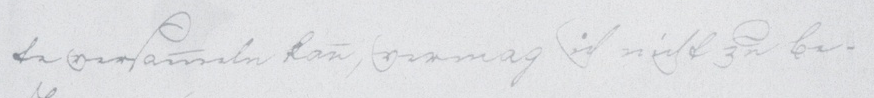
te versammeln kann, vermag ich nicht zu be-
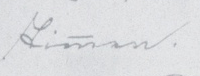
stimmen.
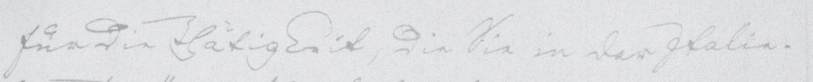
Für die Thätigkeit, die Sie in der Italie-
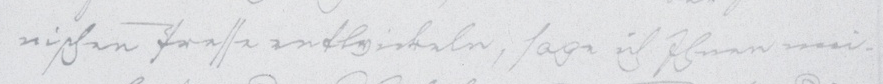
nischen Presse entwickeln, sage ich Ihnen mei-
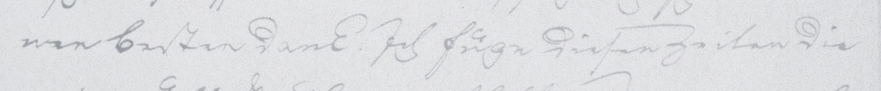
nen besten Dank. Ich füge diesen Zeilen die
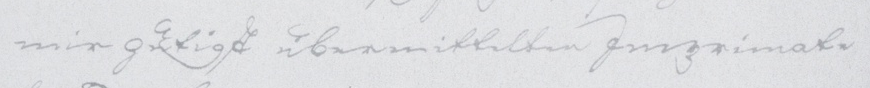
mir gütigst übermittelten Imprimate
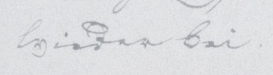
wieder bei.
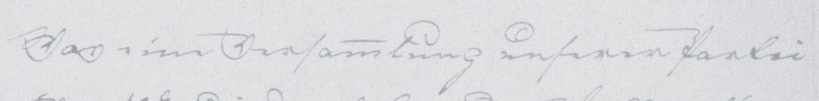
Was eine Versammlung unserer Partei
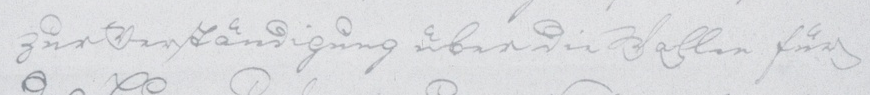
zur Verständigung über die Wahlen für
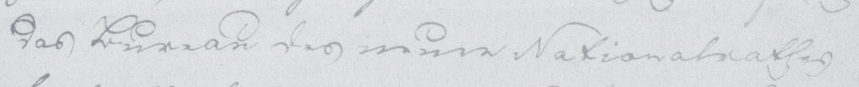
das Bureau des neuen Nationalrathes
